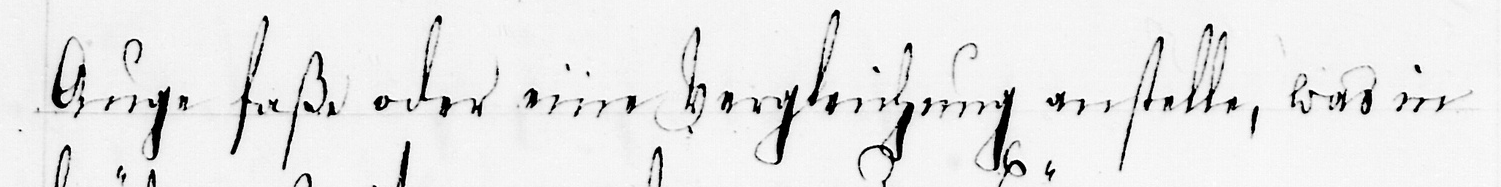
Auge faße oder eine Vergleichung anstelle, was in
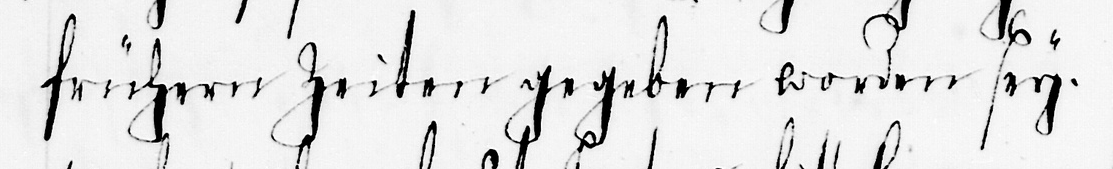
frühern Zeiten gegeben worden sey.
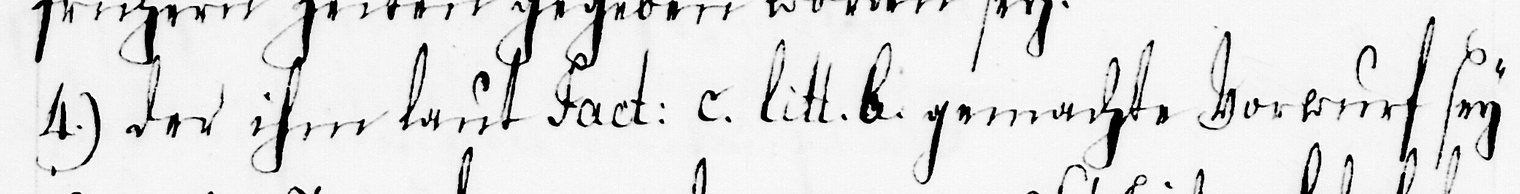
4.) Der ihm laut Fact: c. litt. b. gemachte Vorwurf sey
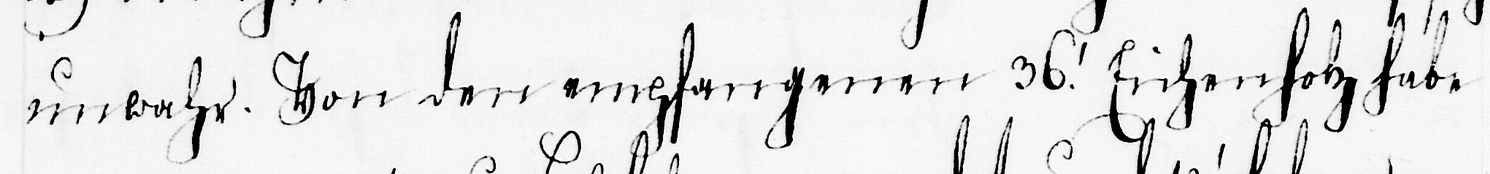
unwahr. Von den empfangenen 36.‘ Eichenholz habe
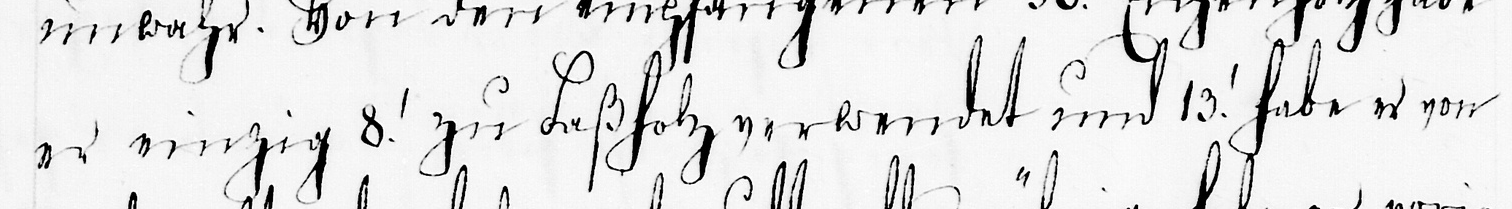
er einzig 8.‘ zu Faßholz verwendet und 13.‘ habe er von
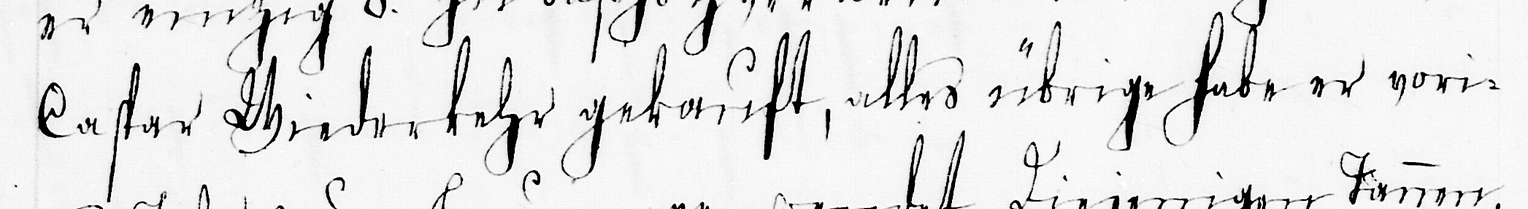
Caspar Wiederkehr gekauft, alles übrige habe er vori¬
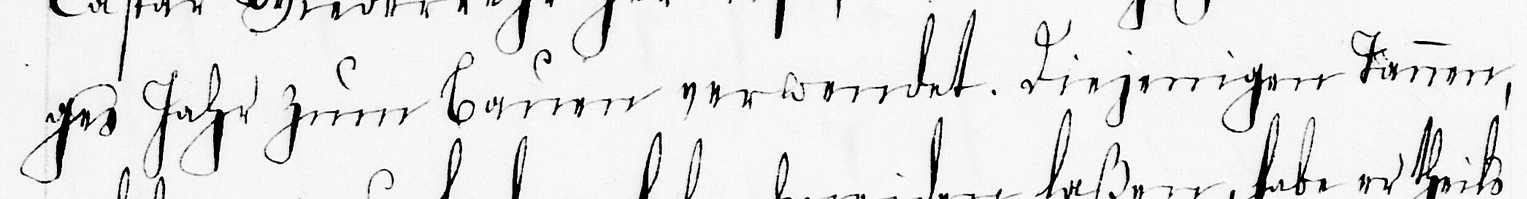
ges Jahr zum Bauen verwendet. Diejenigen Tannen,
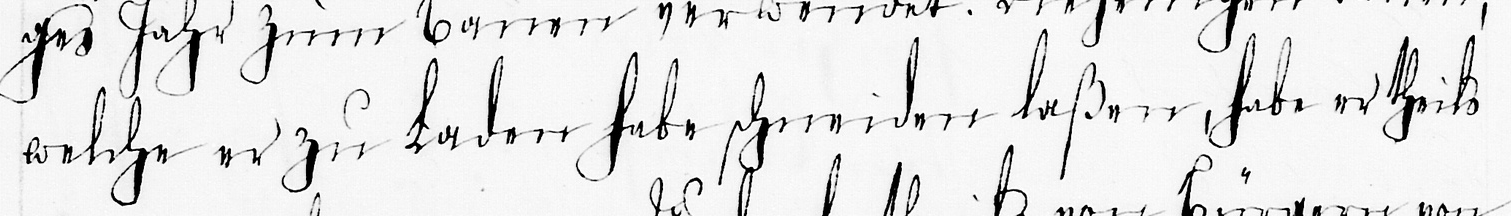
welche er zu Laden habe schneiden laßen, habe er theils
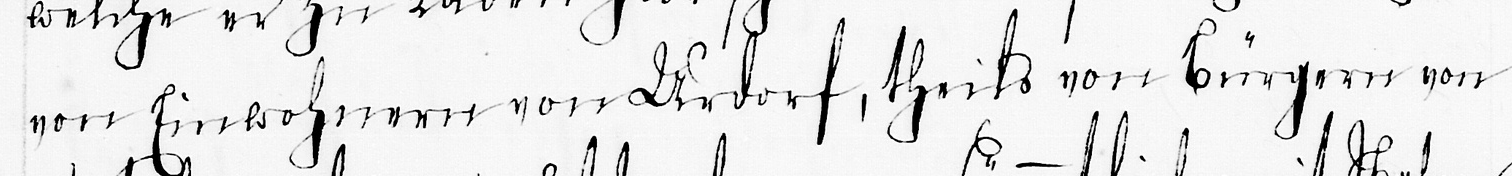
von Einwohnern von Urdorf, theils von Bürgern von
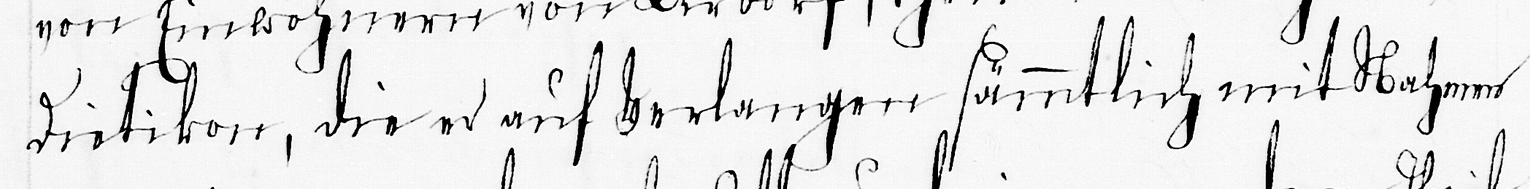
Dietikon, die er auf Verlangen sämmtlich mit Nahmen
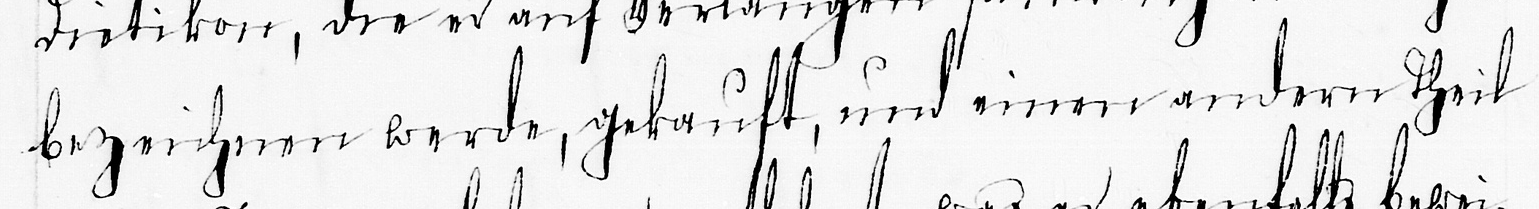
bezeichnen werde, gekaut, und einen andern Theil
